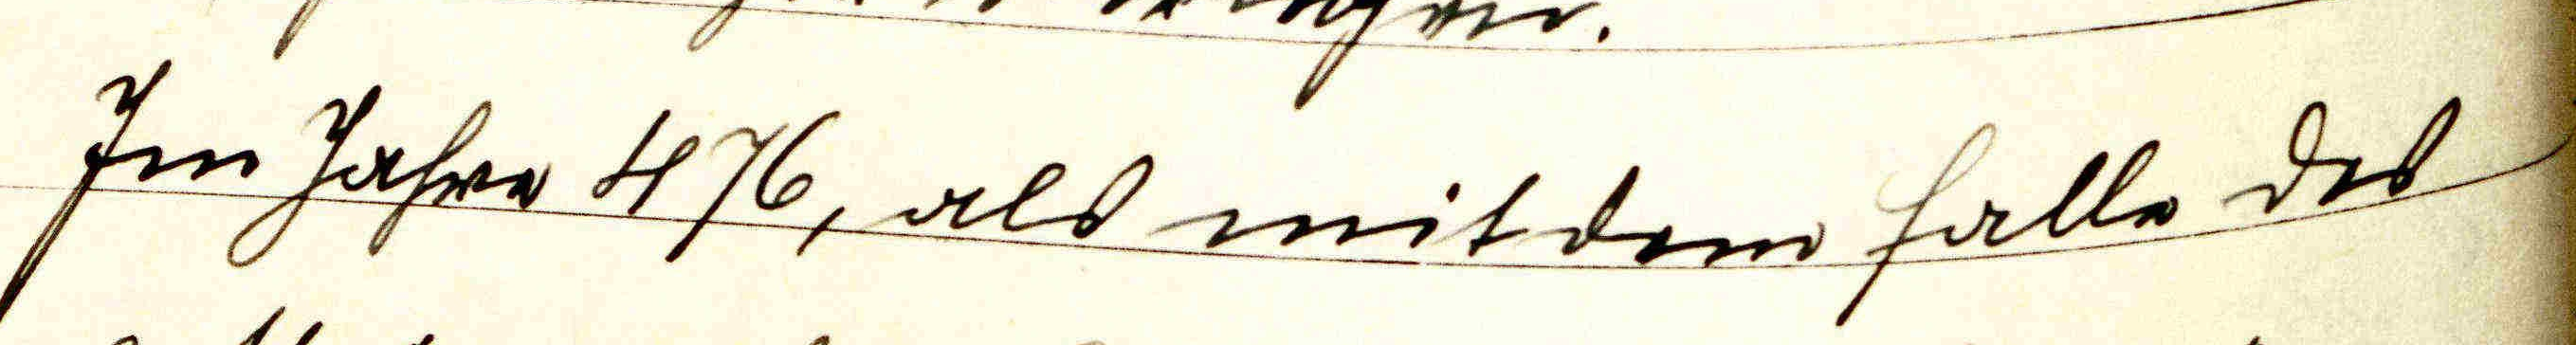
Im Jahre 476, als mit dem falle des
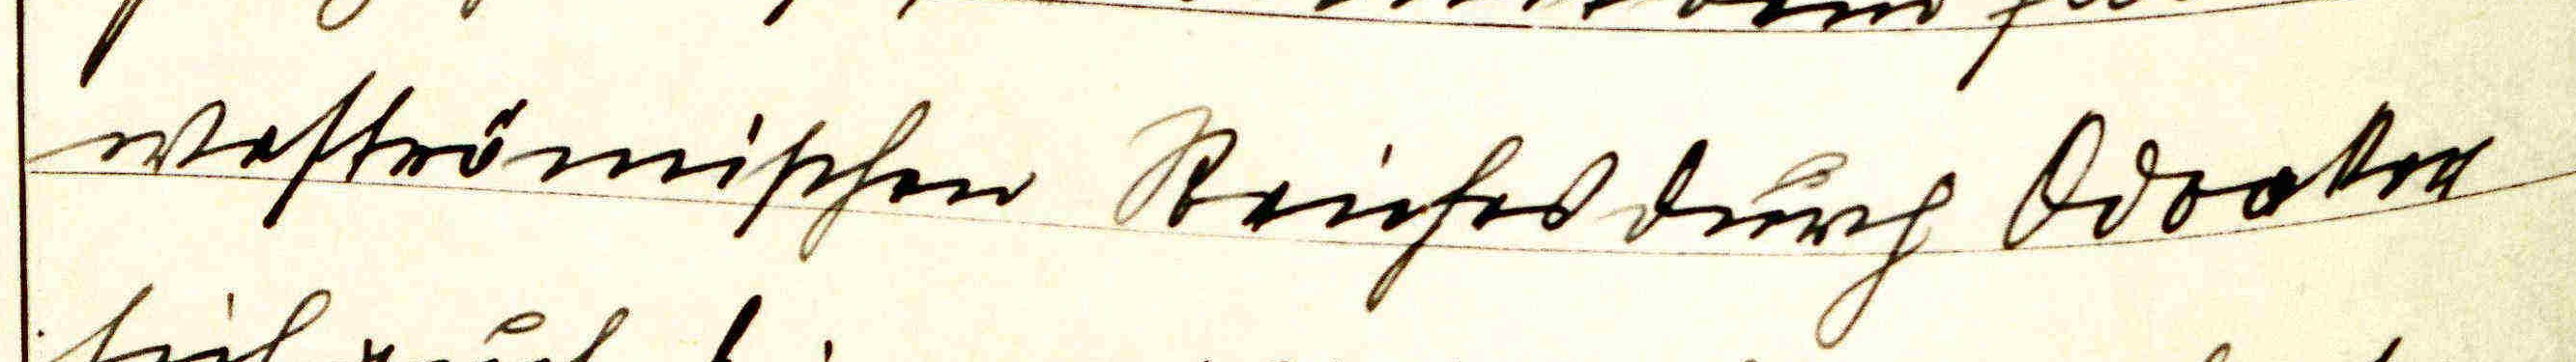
weströmischen Reiches durch Odoaker
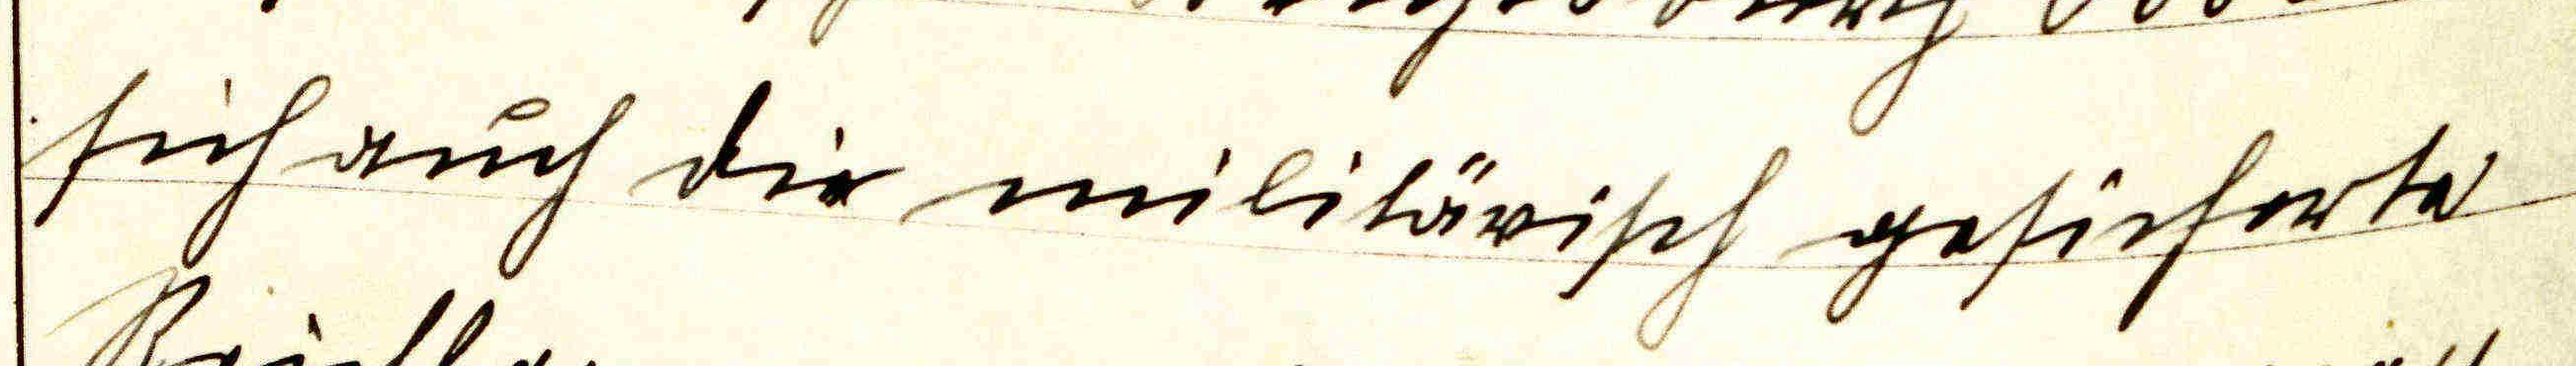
sich auch die militärisch gesicherte
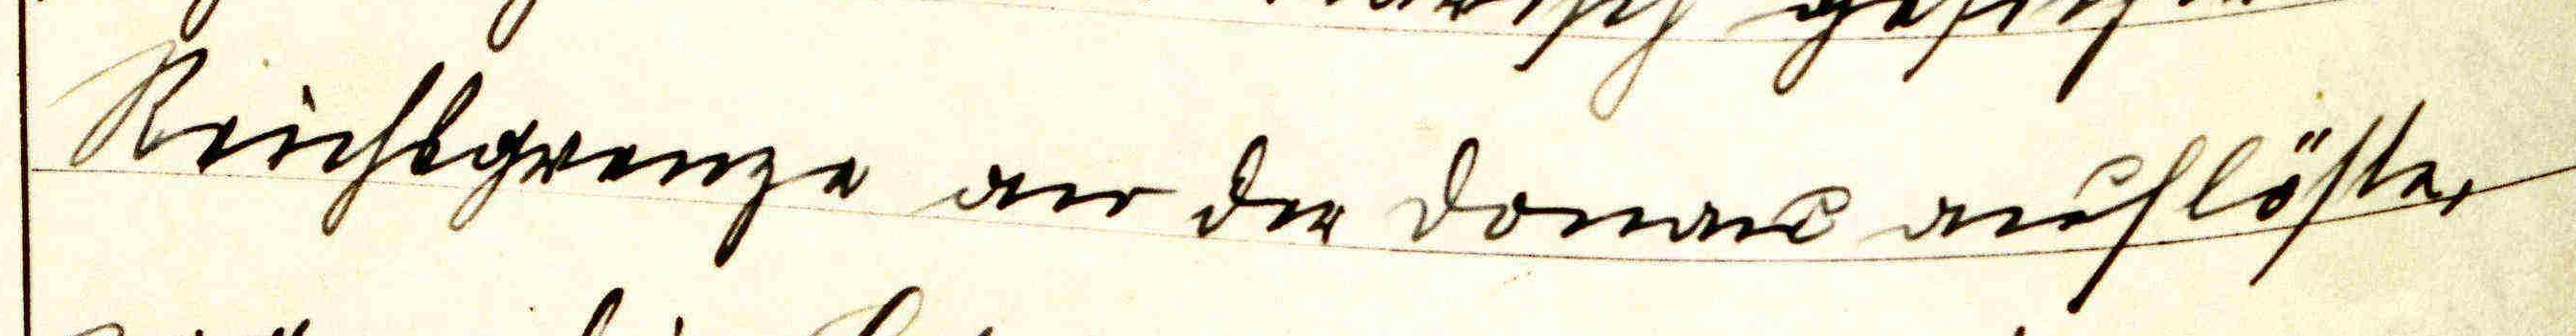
Reichsgrenze an der Donau auflöste,
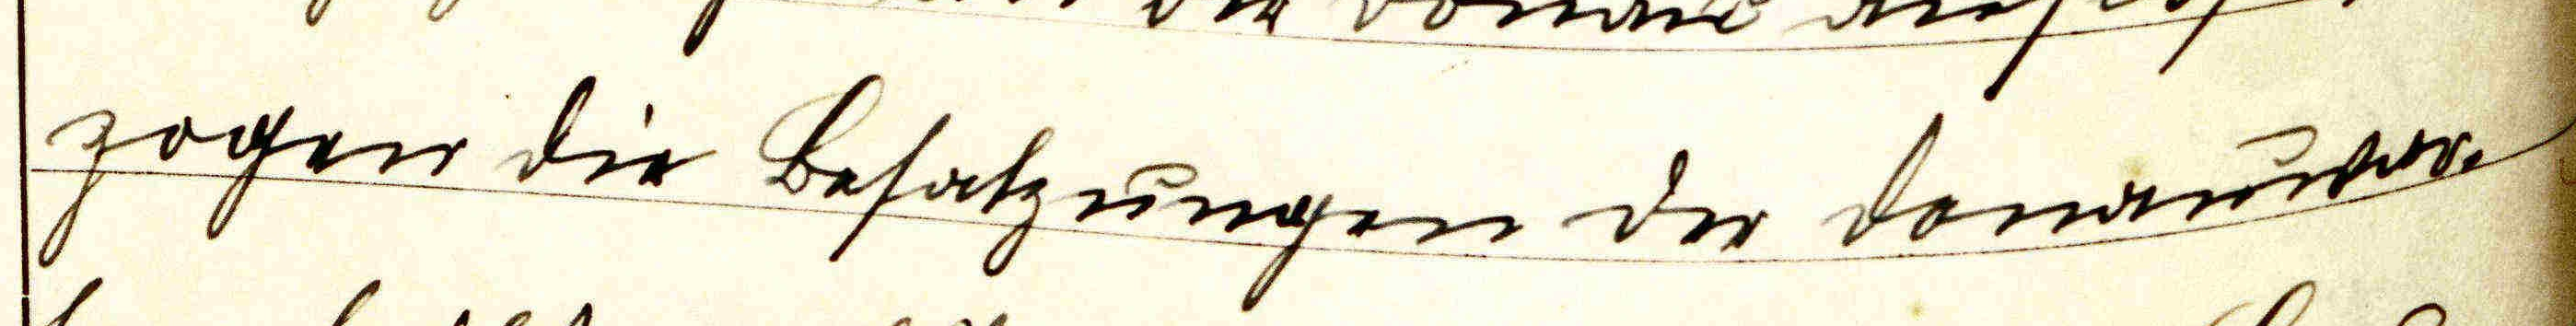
zogen die Besatzungen der Donauwar-
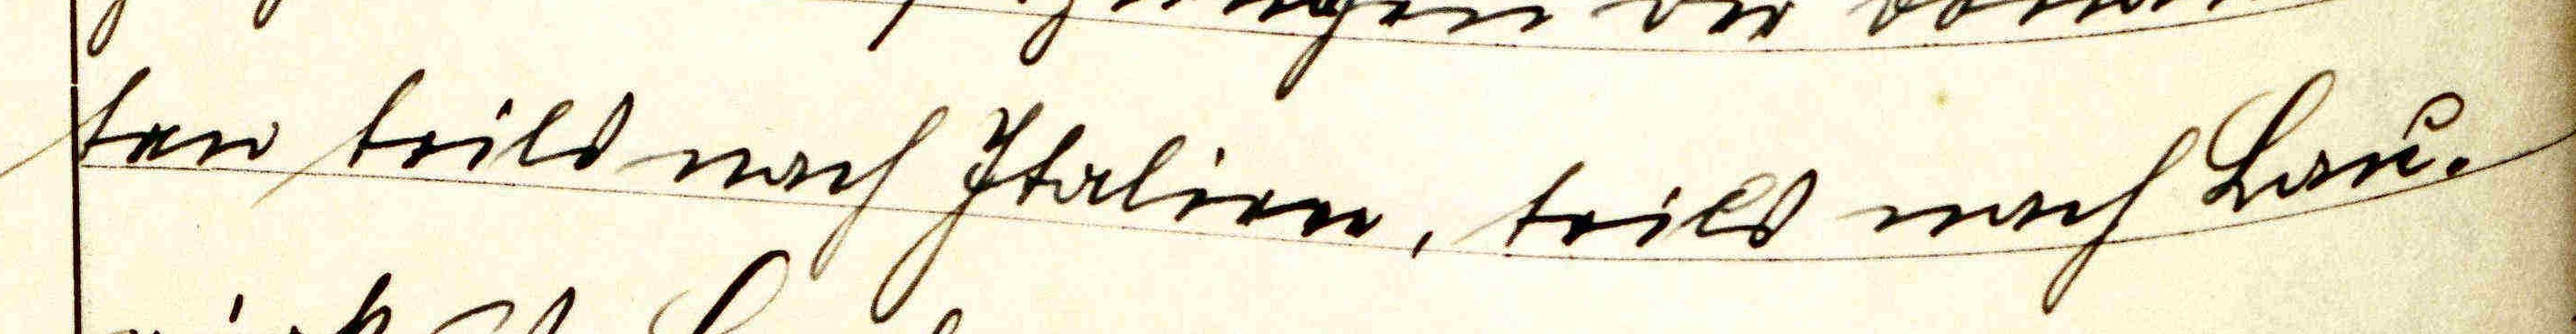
ten teils nach Italien, teils nach Lau-
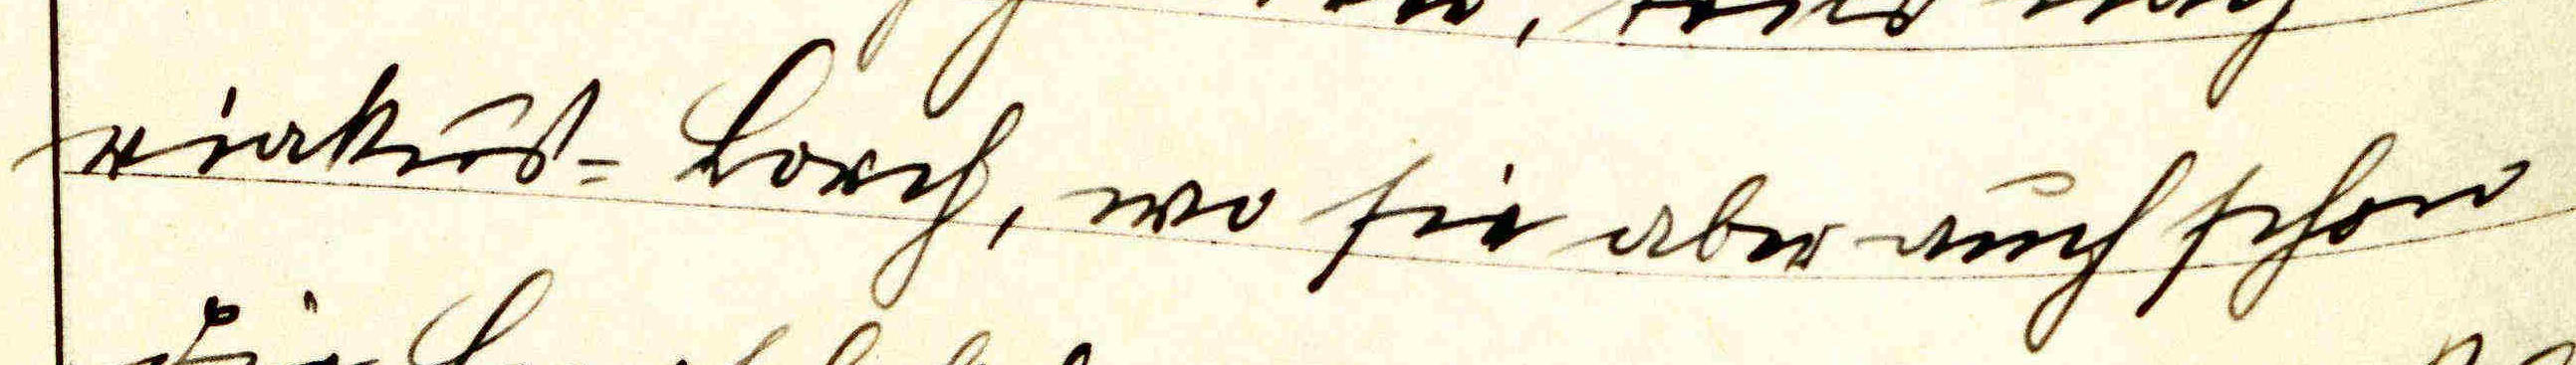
riakus-Lorch, wo sie aber auch schon
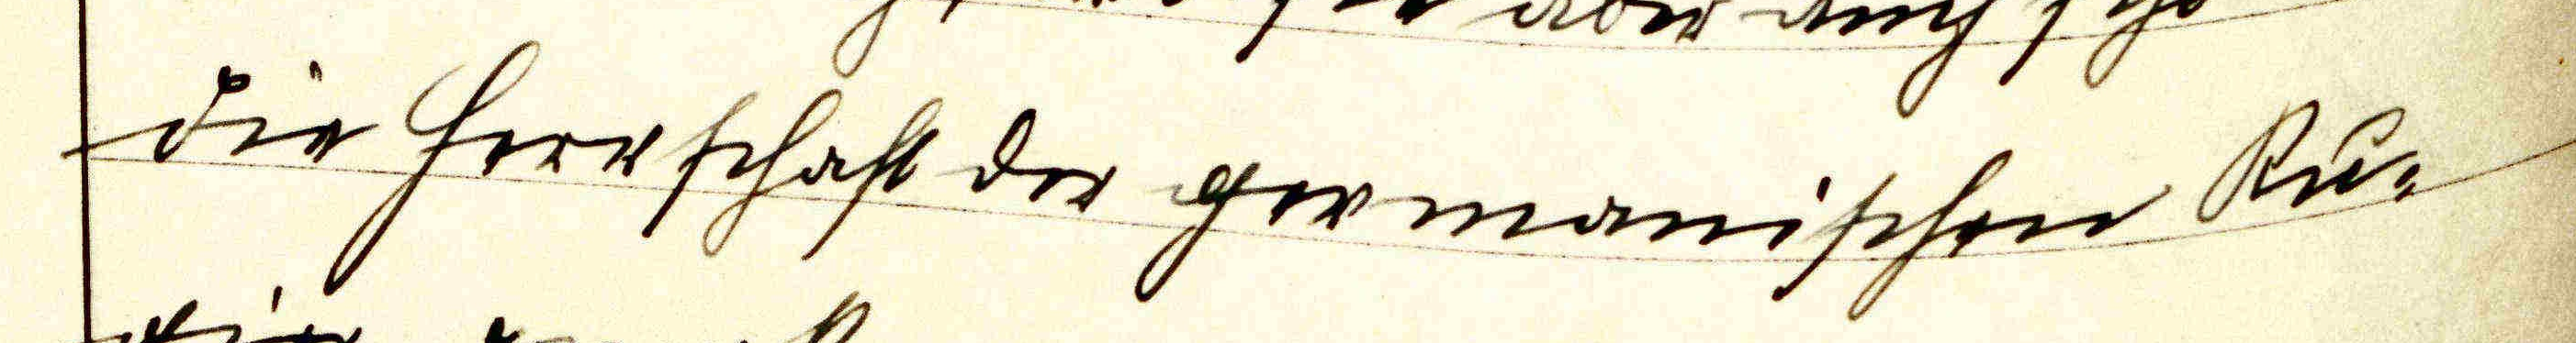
die Herrschaft der germanischen Ru-
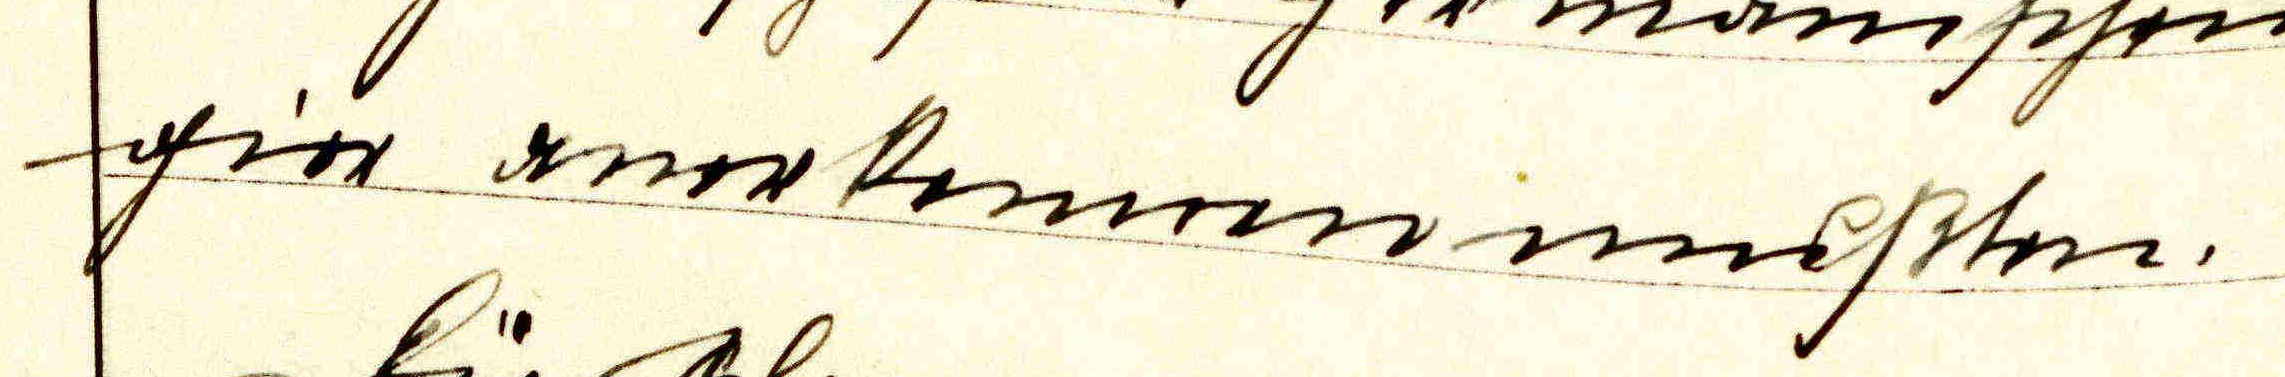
gier anerkennen mußten.
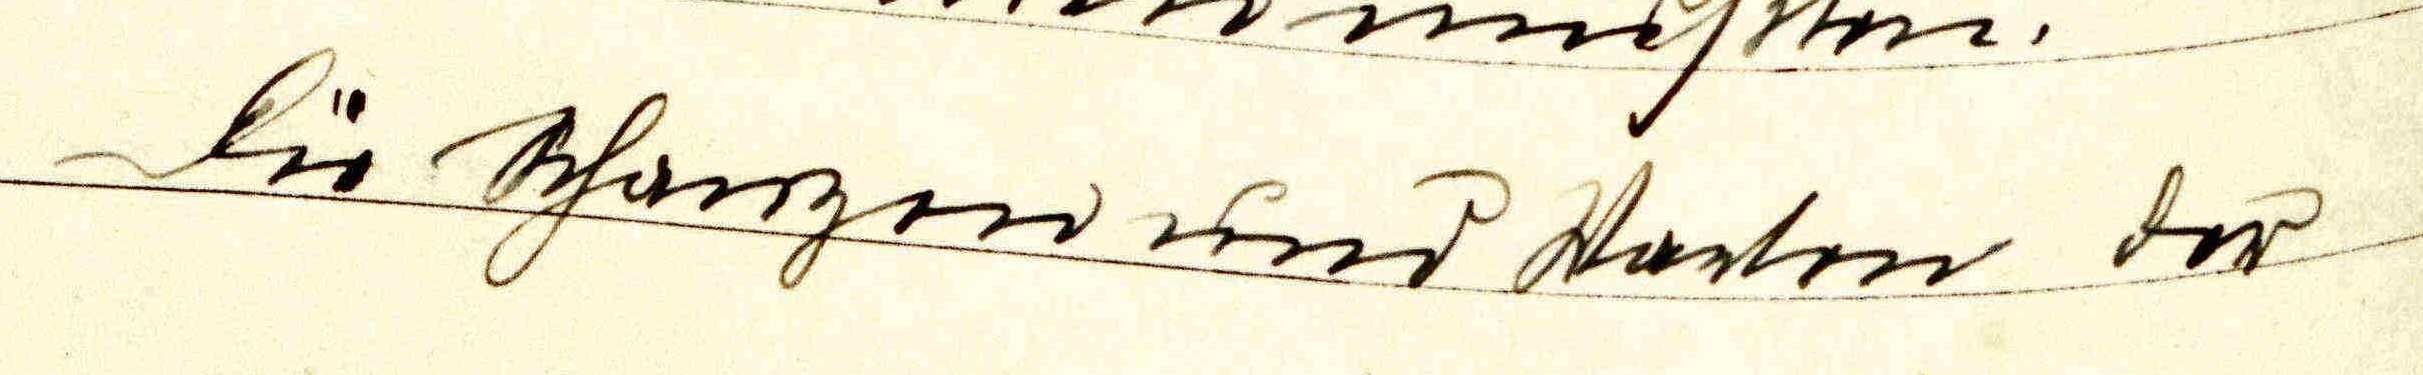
Die Schanzen und Warten der
